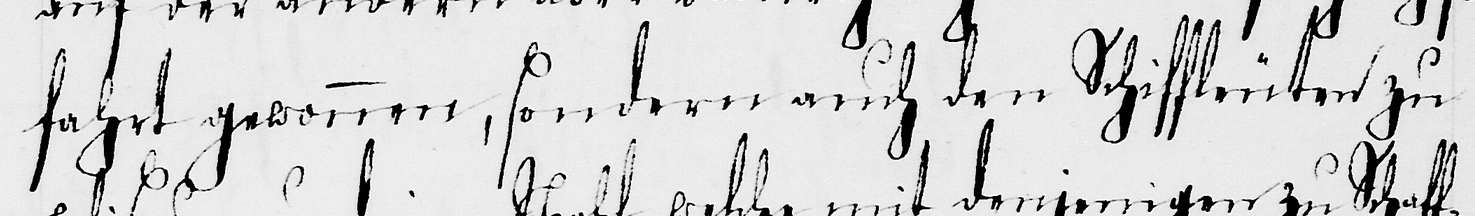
fahrt gewonnen, sondern auch den Schiffleuten zu
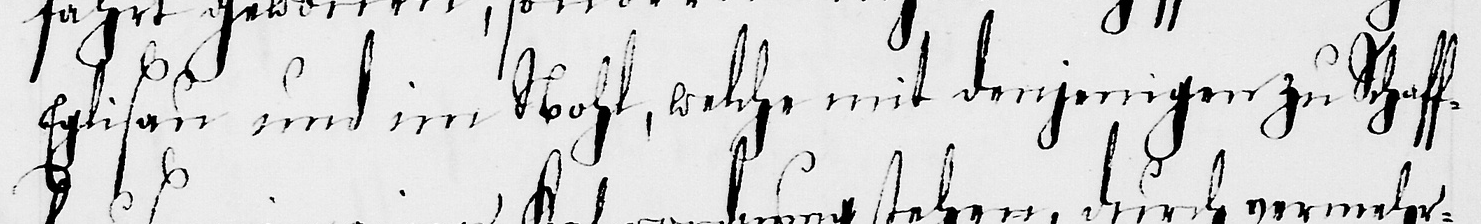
Eglisau und im Nohl, welche mit denjenigen zu Schaff¬
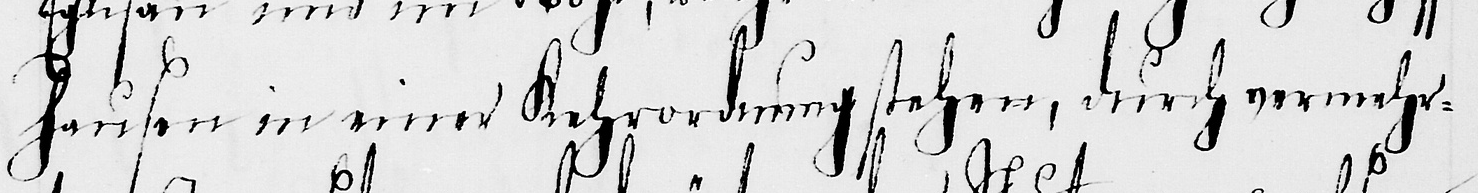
hausen in einer Kehrordnung stehen, durch vermehr¬
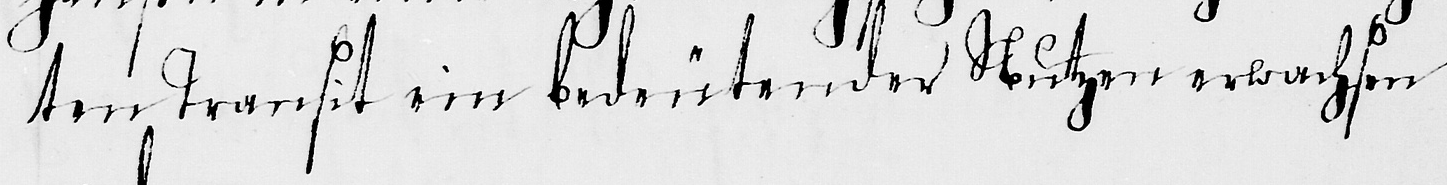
ten Transit ein bedeutender Nutzen erwachsen
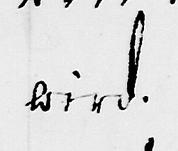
wird.
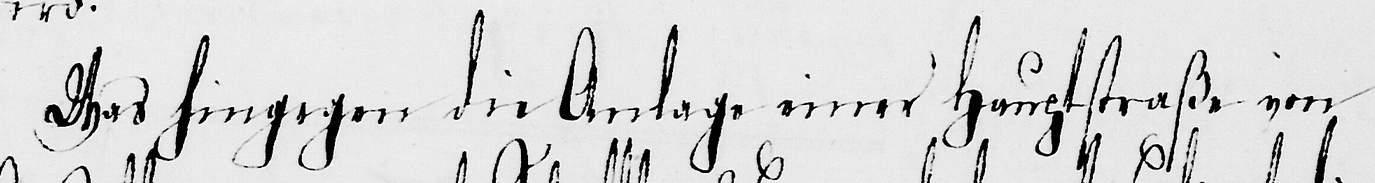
Was hingegen die Anlage einer Hauptstraße von
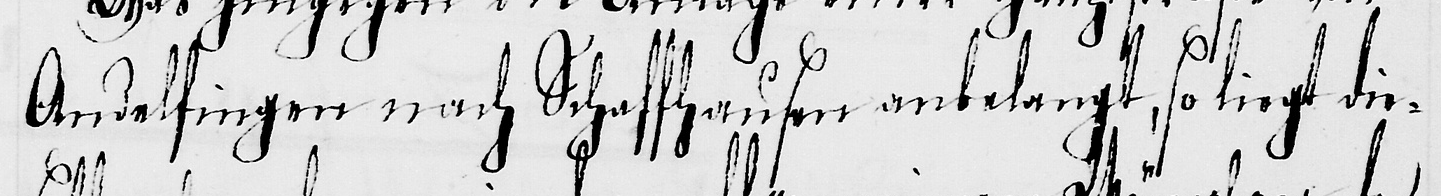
Andelfingen nach Schaffhausen anbelangt, so liegt d¬
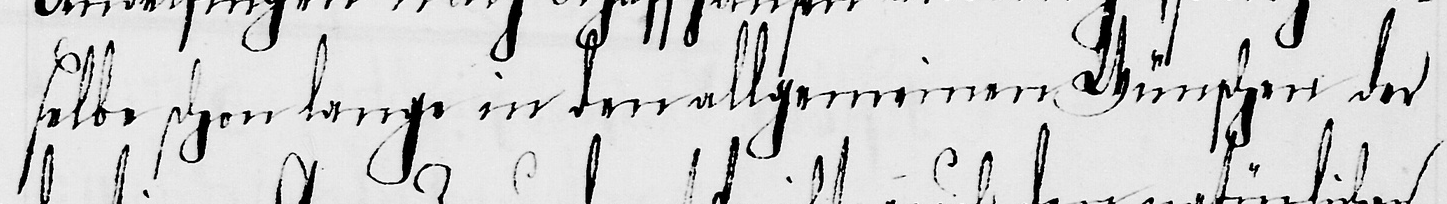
selbe schon lange in den allgemeinen Wünschen der
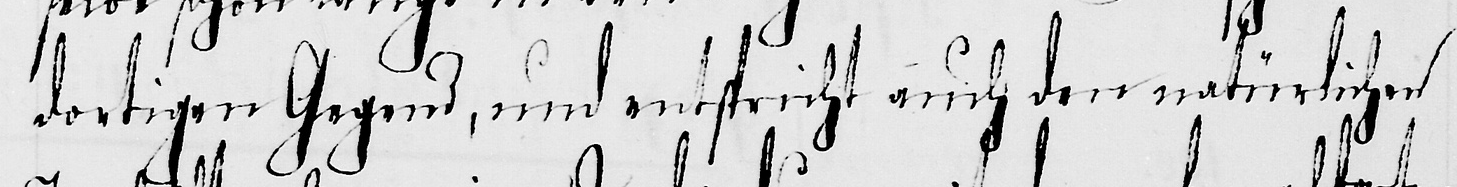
dortigen Gegend, und entspricht auch den natürlichen
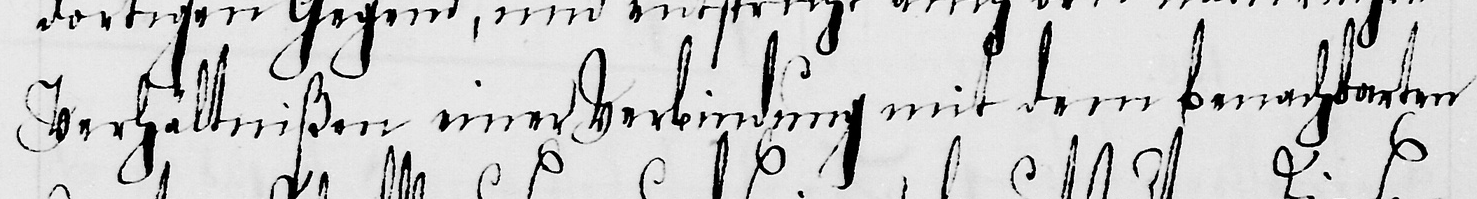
Verhältnißen einer Verbindung mit dem benachbarten
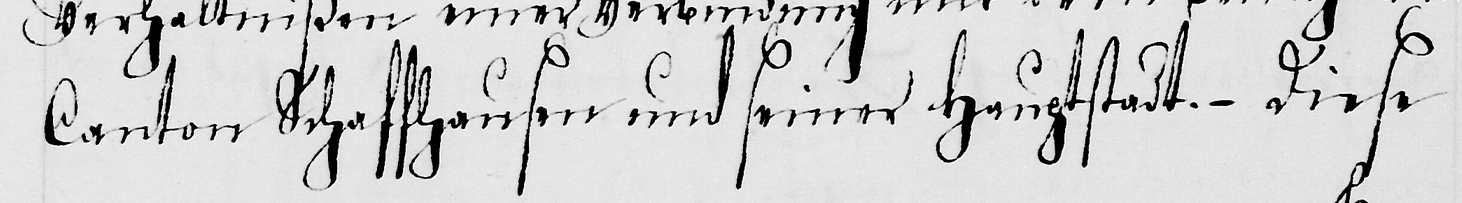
Canton Schaffhausen und seiner Hauptstadt. – Diese
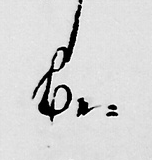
ie¬
